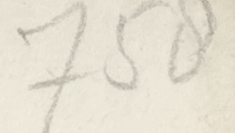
758
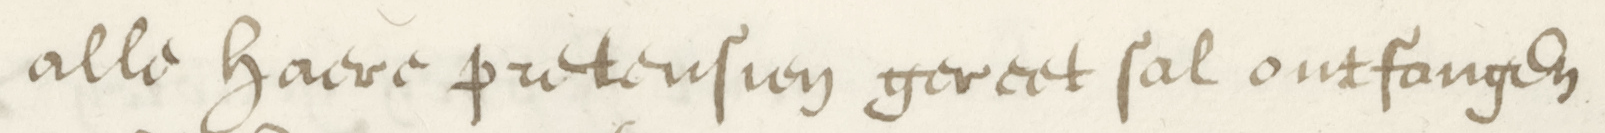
alle haere pretensien gereet sal ontfangen
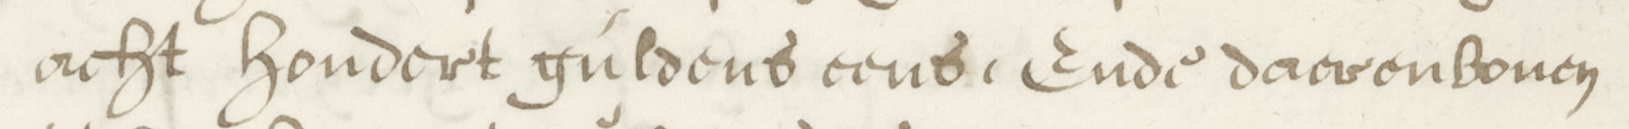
acht hondert guldens eens, Ende daerenbouen
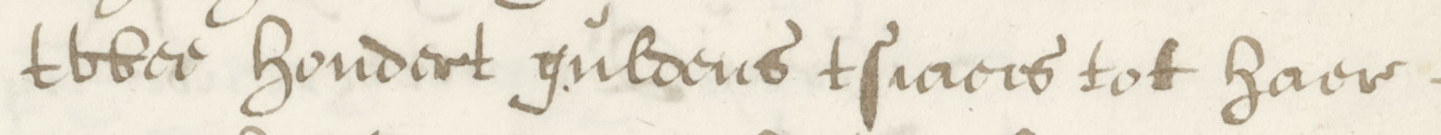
twee hondert guldens tsiaers tot haer
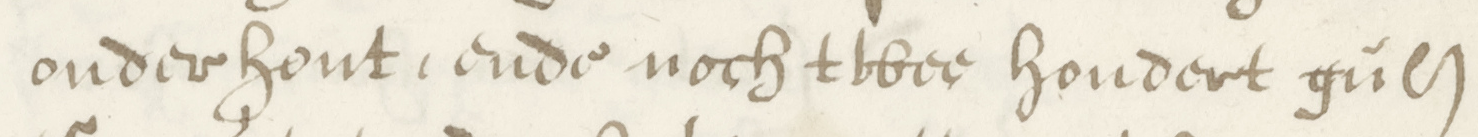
onderhout, ende noch twee hondert gul
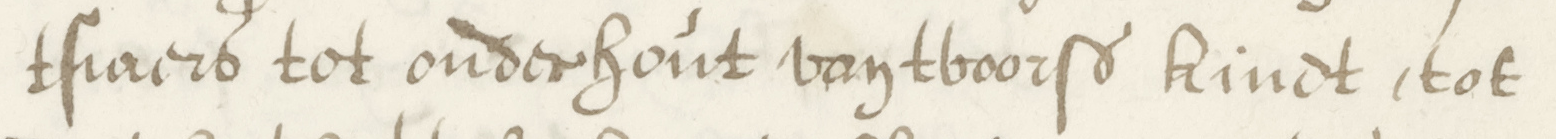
tsiaers tot onderhout van tvoors kindt, tot
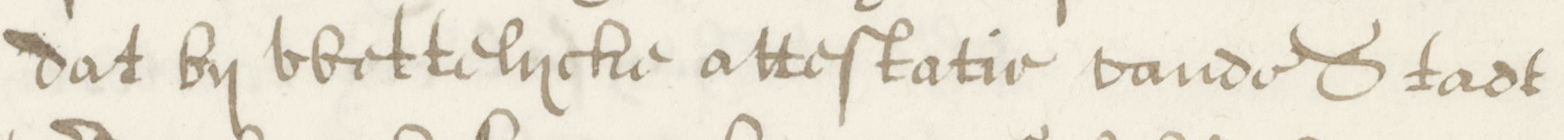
dat by wettelycke attestatie vande Stadt
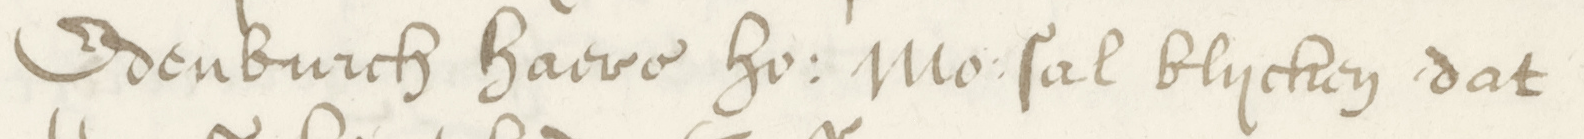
Edenburch haere ho:Mo: sal blycken, dat
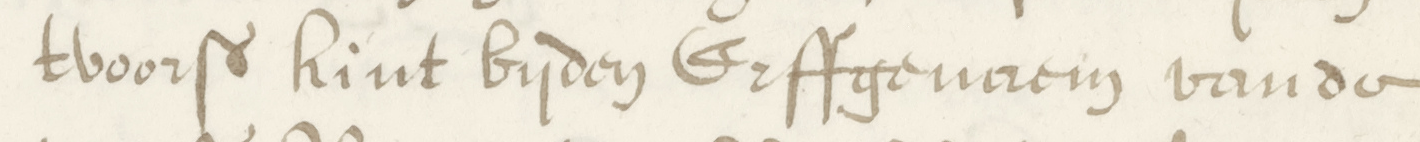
tvoors kint byden Erffgenaem vande
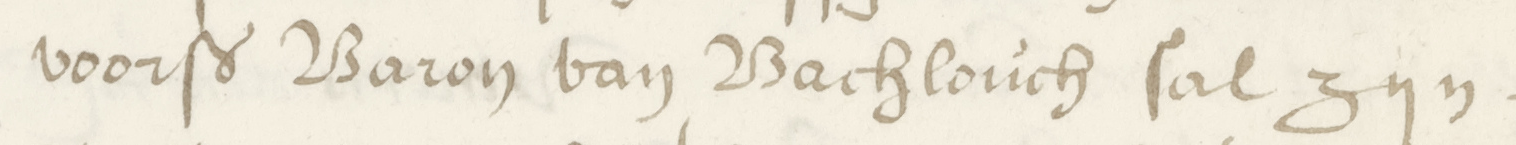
voors Baron van Bachlouch sal zijn
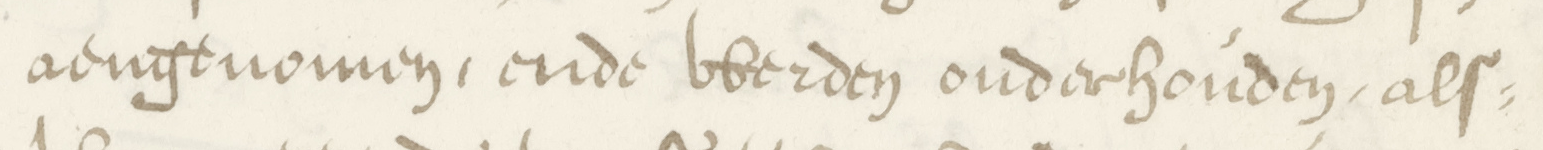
aengenomen, ende werden onderhouden, als„
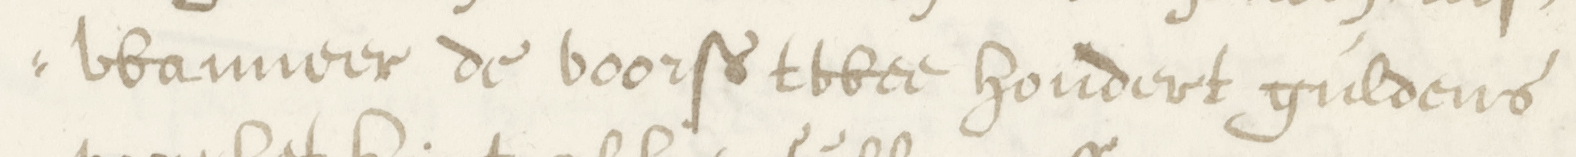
,,wanneer de voors twee hondert guldens
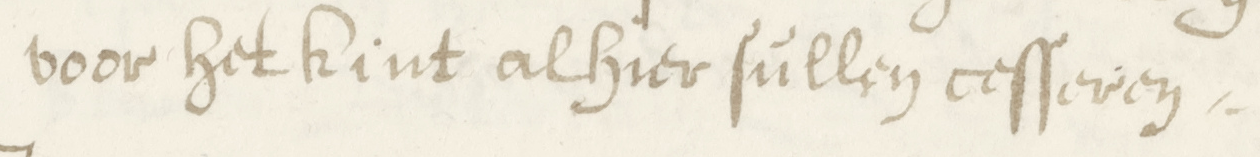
voor het kint alhier sullen cesseren.
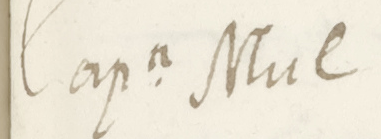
Capn. Mul
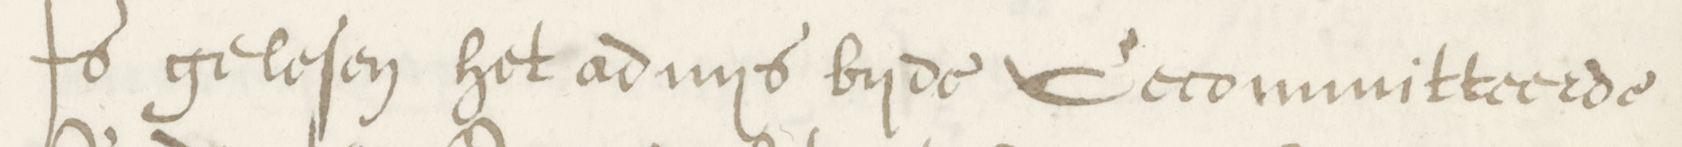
Is gelesen het aduys byde Gecommitteerde
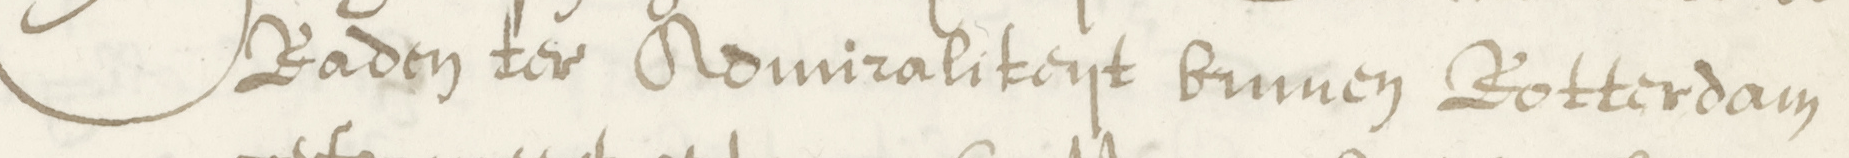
Raden ter Admiraliteyt binnen Rotterdam
